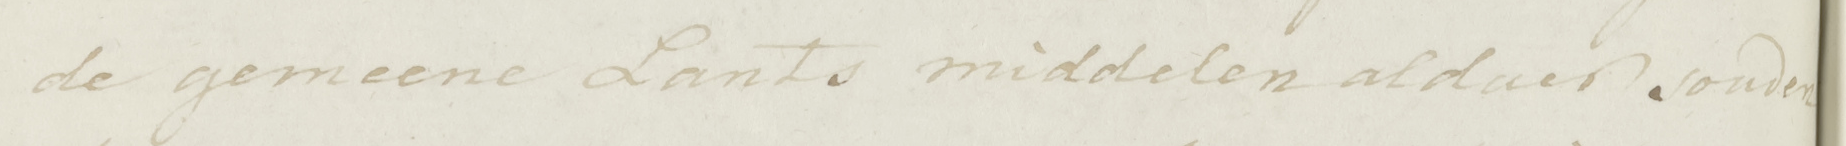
de gemeene Lants middelen aldaer souden
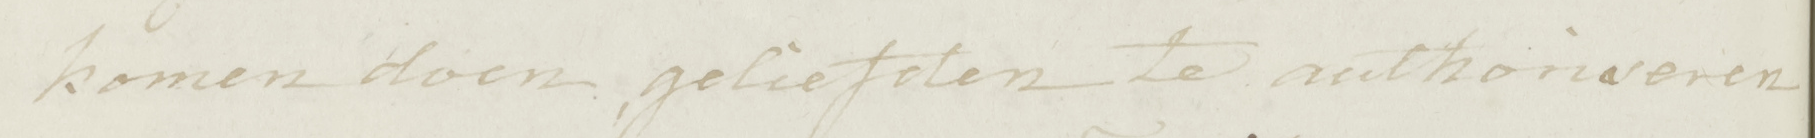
komen doen geliefden te authoriseren
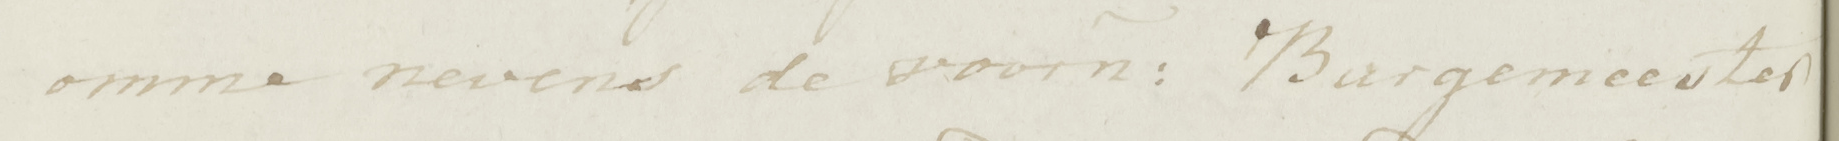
omme nevens de voorn: Burgemeester
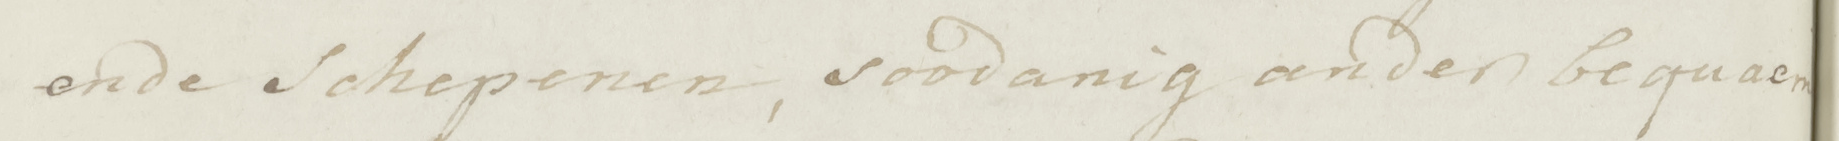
ende Schepenen, soodanig ander bequaem
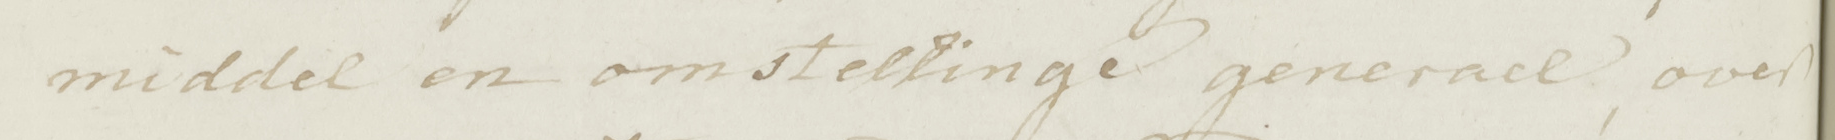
middel en omstellinge generael over
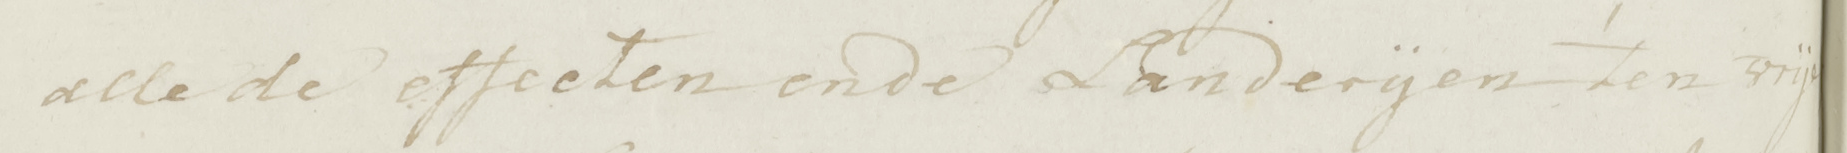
alle de effecten ende Landerijen ten vrije
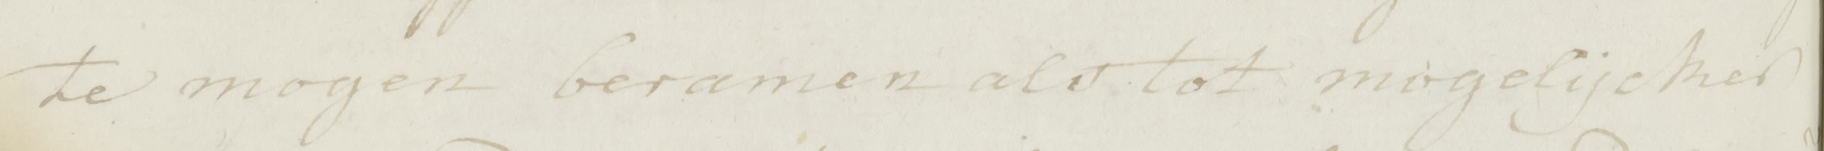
te mogen beramen als tot mogelijcker
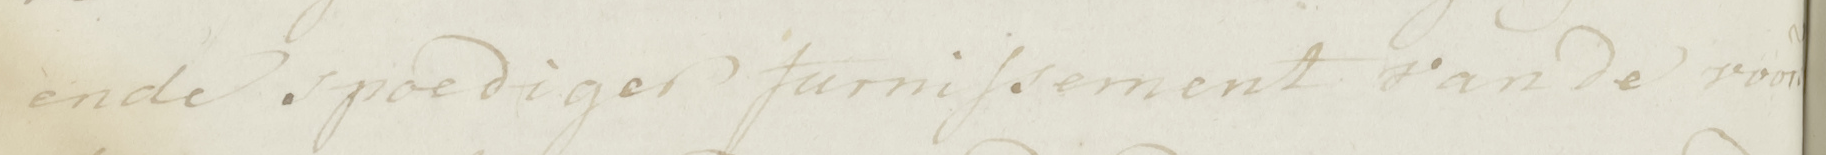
ende spoediger furnissement van de voors
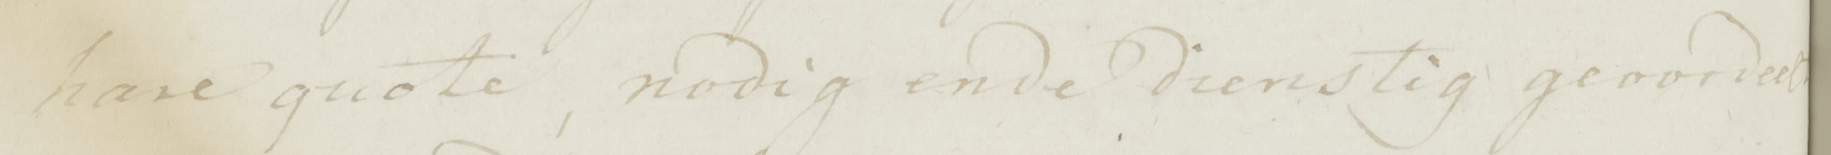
hare quote, nodig ende dienstig geoordeeld
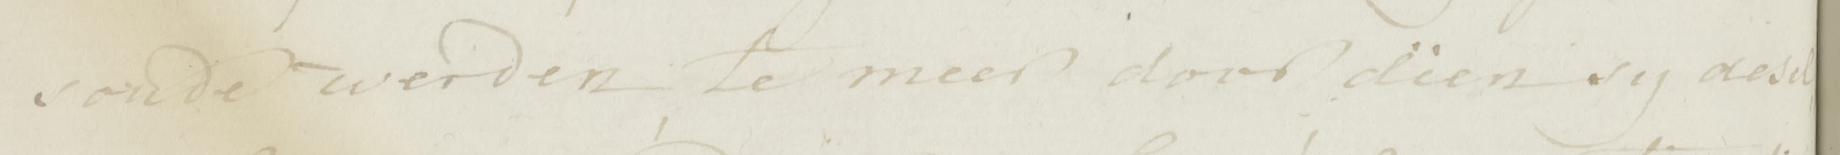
soude werden, te meer door dien sy desel
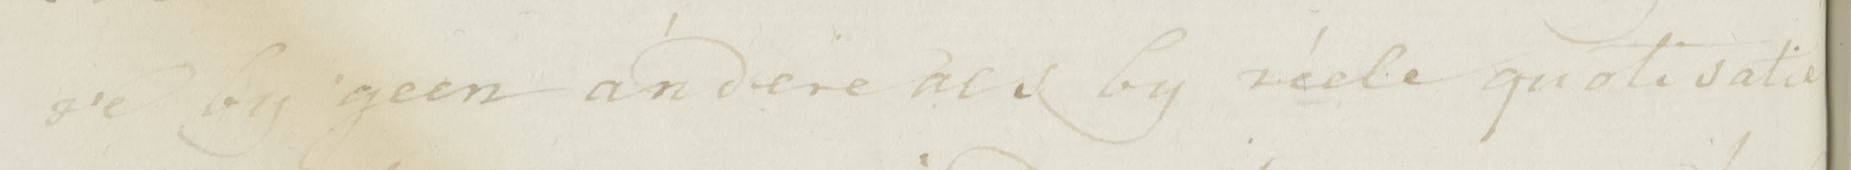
ve bij geen andere als by réele quotisatie
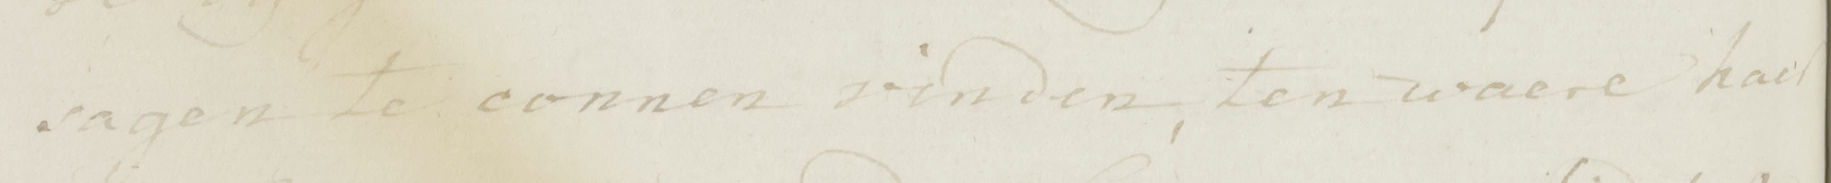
sagen te connen vinden, ten waere, haer
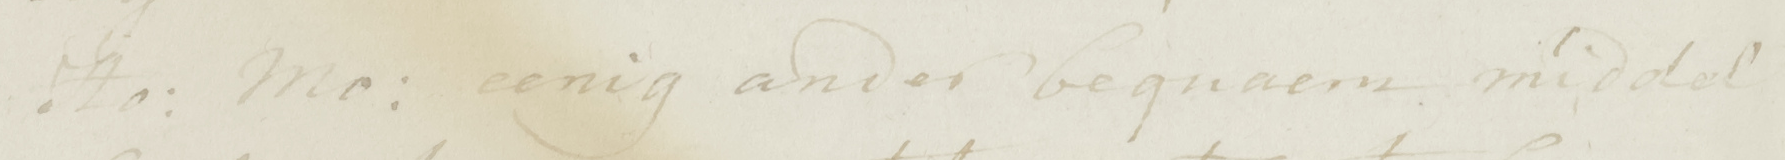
Ho: Mo: eenig ander bequaem middel
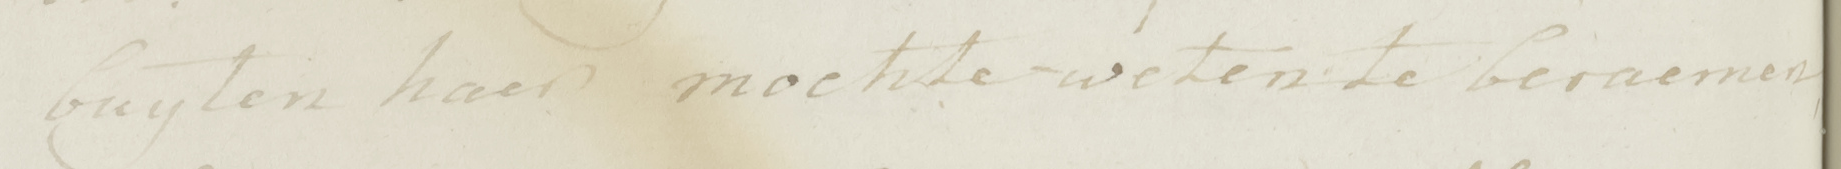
buyten haer mochte weten te beraemen.
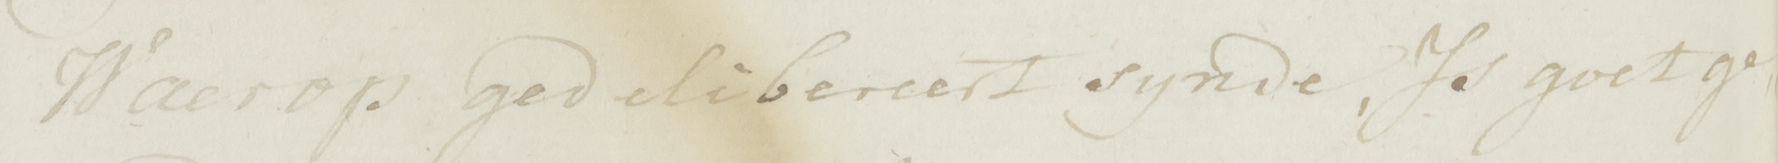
Waerop gedelibereert synde, Is goetge„
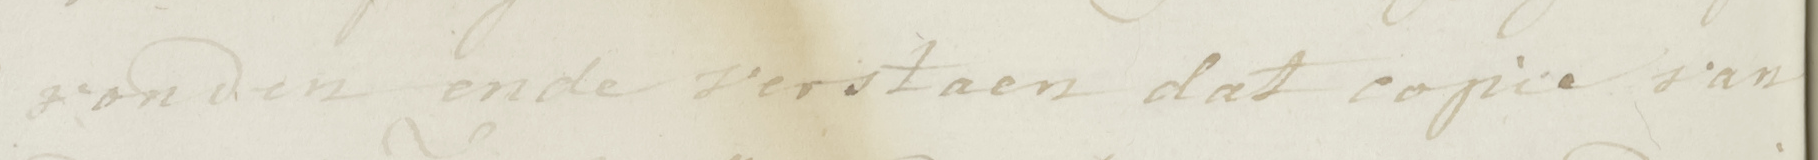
vonden ende verstaen dat copie van
